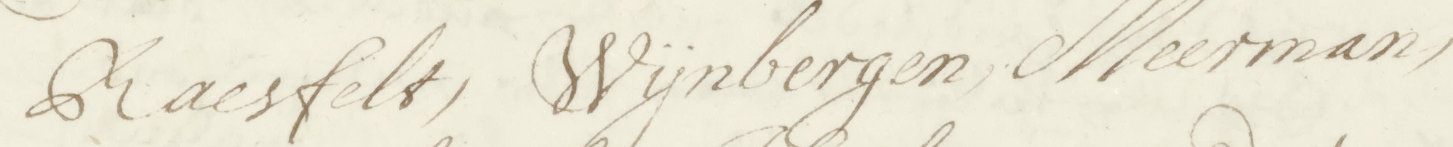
Raesfelt, Wijnbergen, Meerman,
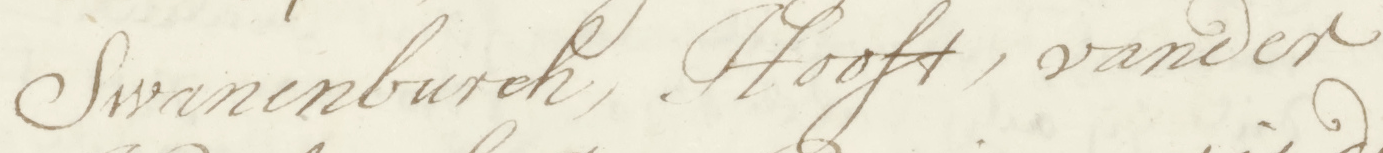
Swanenburch, Hooft, vander
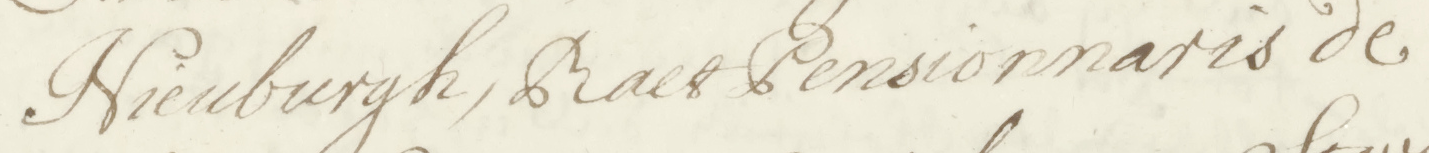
Nieuburgh, Raet Pensionnaris de
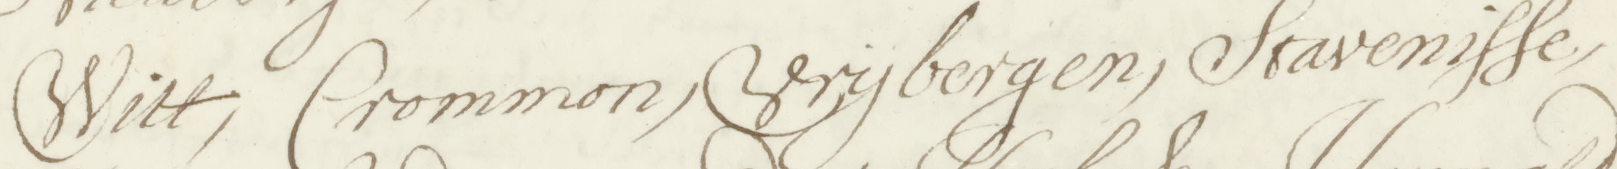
Witt, Crommon, Vrijbergen, Stavenisse,
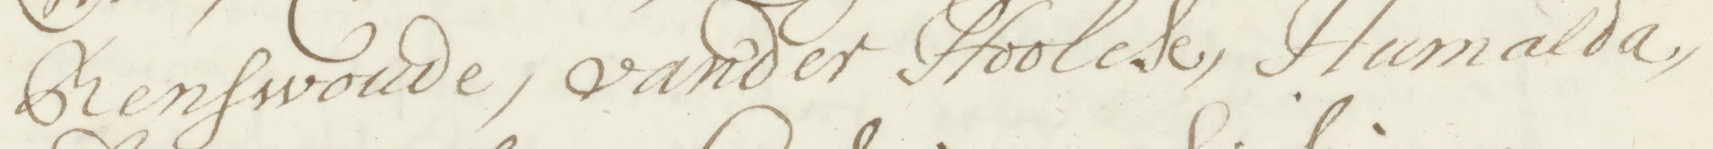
Renswoude, vander Hoolck, Humalda,
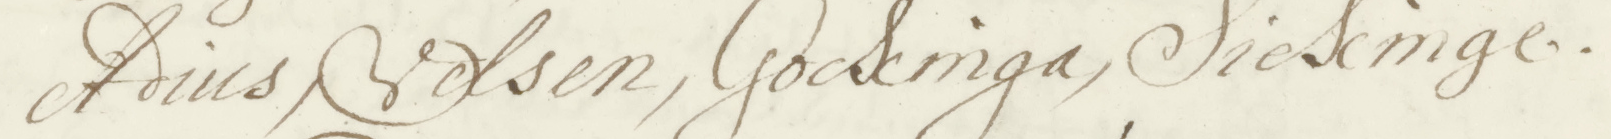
Adius, Velsen, Gockinga, Sickinge.
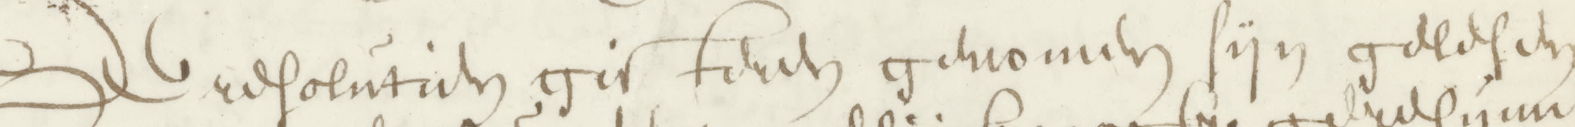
De resolutien gisteren genomen sijn gelesen
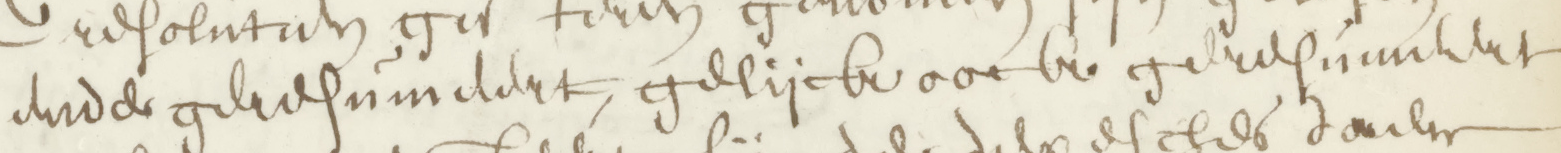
ende geresumeert, gelijck oock geresumeert
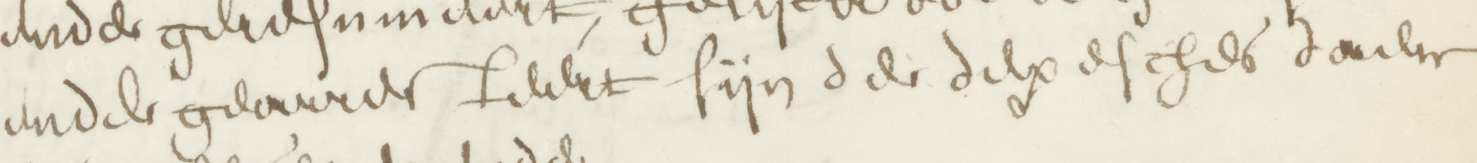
ende gearresteert sijn de depesches daer
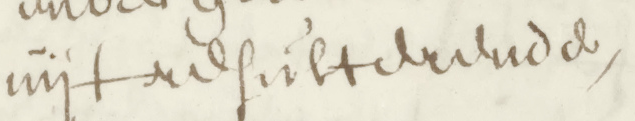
uijt resulterende.
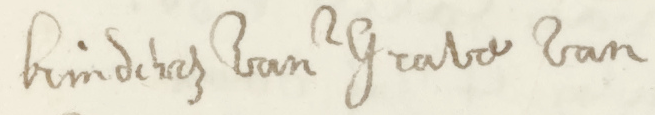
kinderen van Grave van
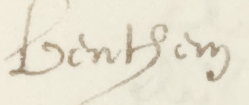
Benthem
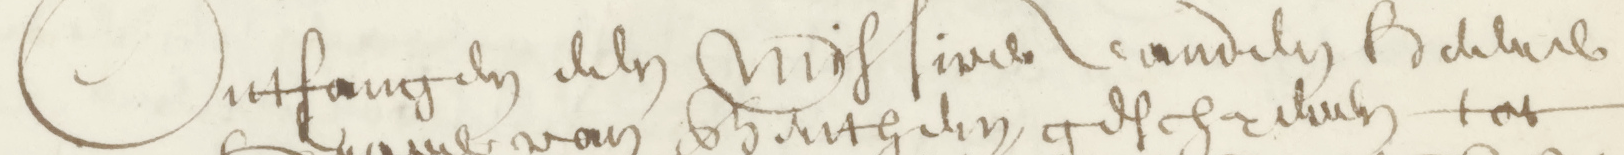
Ontfangen een Missive vanden Heere
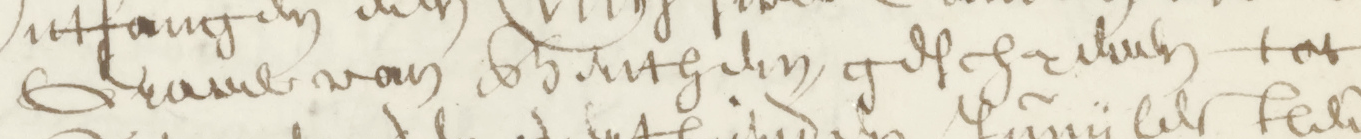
Grave van Benthem, geschreven tot
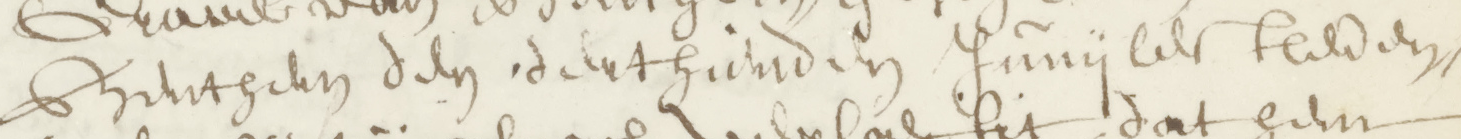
Benthem den derthienden Junij lestleden,
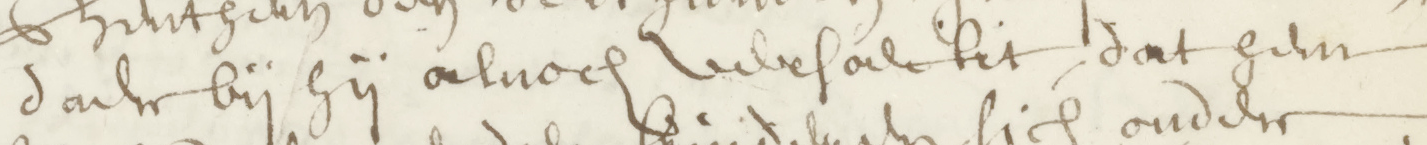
daerbij hij alnoch versoeckt, dat hem
